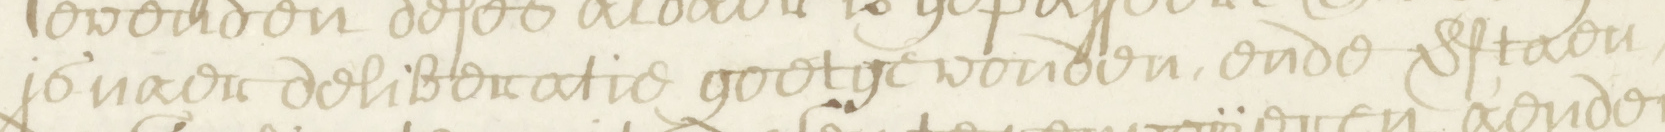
is naer deliberatie goetgevonden, ende vstaen,
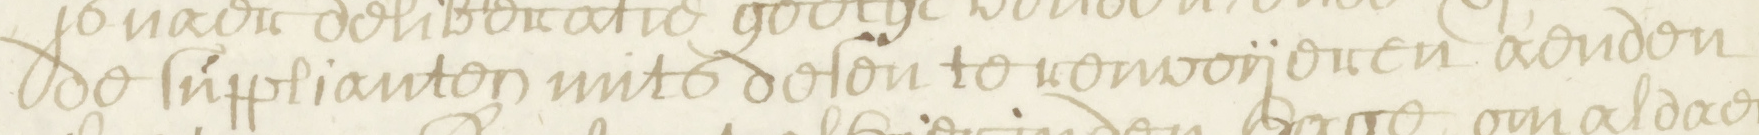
de supplianten mits desen te renvoijeren aenden
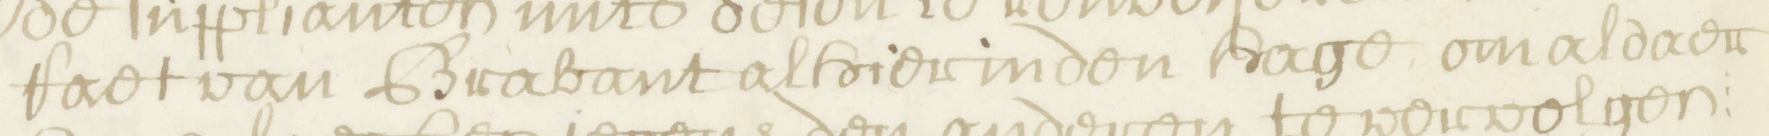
Raet van Brabant alhier inden hage, om aldaer
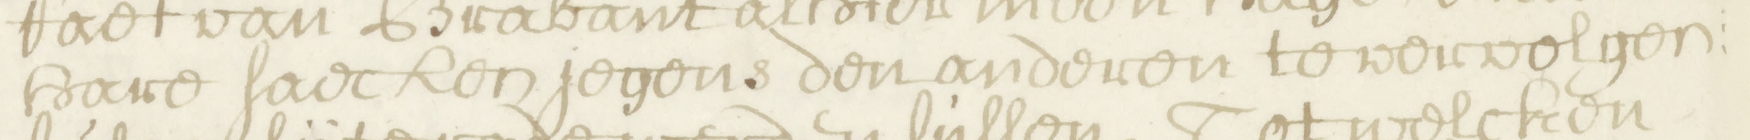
hare saecken jegens den anderen te vervolgen:
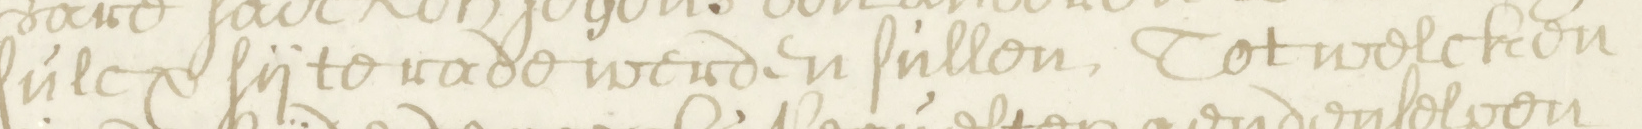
sulcx sij te rade werden sullen, Tot welcken
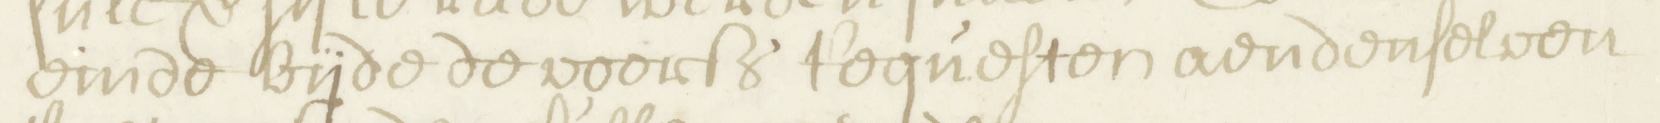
einde bijde de voors Requesten aen denselven
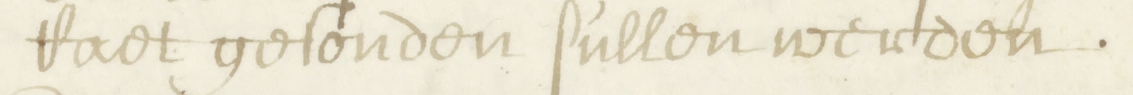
Raet gesonden sullen werden.
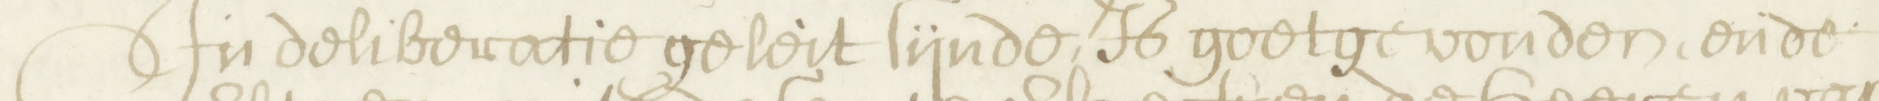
In deliberatie geleit sijnde, Is goetgevonden, ende
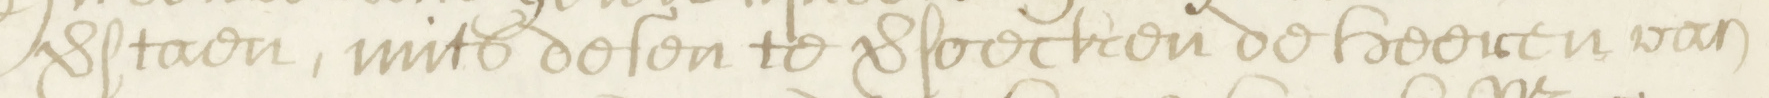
vstaen, mits desen te vsoecken de heeren van
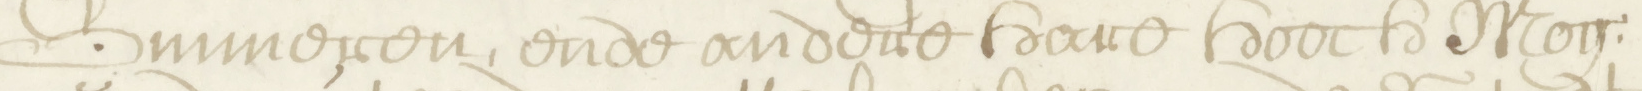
Ommeren, ende andere hare hooch Mog:
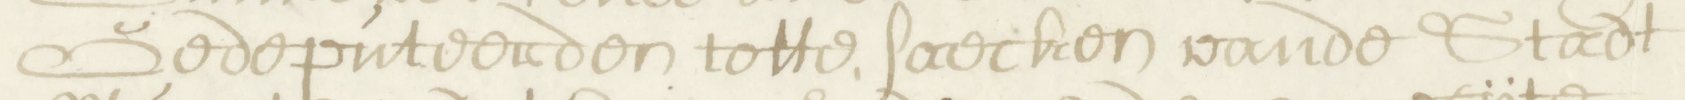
Gedeputeerden totte saecken vande Stadt
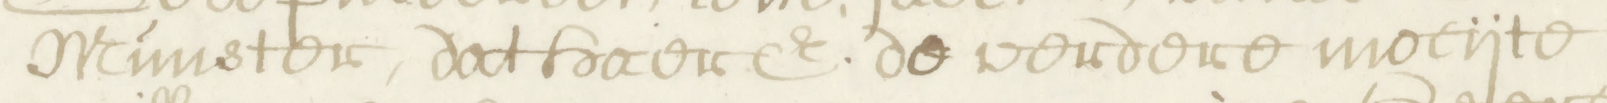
Munster, dat haer E. de verdere moeijte
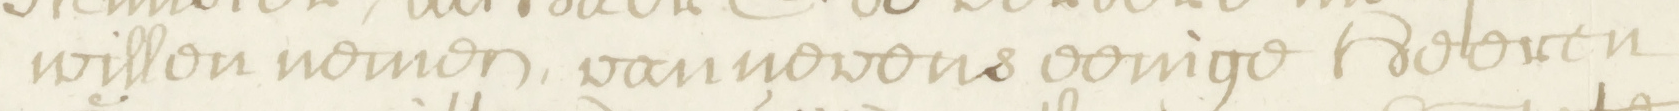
willen nemen, van nevens eenige Heeren
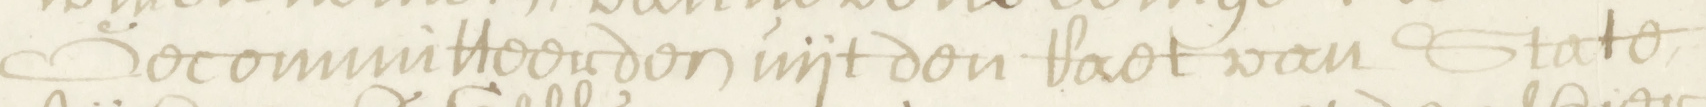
Gecommitteerden uijt den Raet van State,
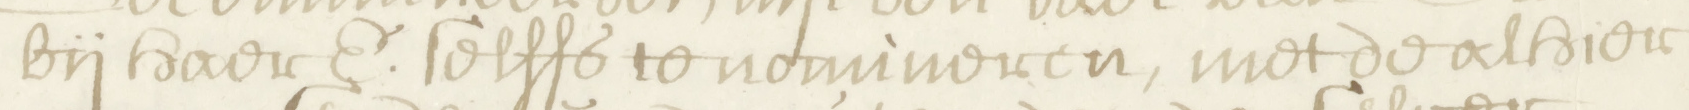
bij haer E. selffs te nomineren, met de alhier
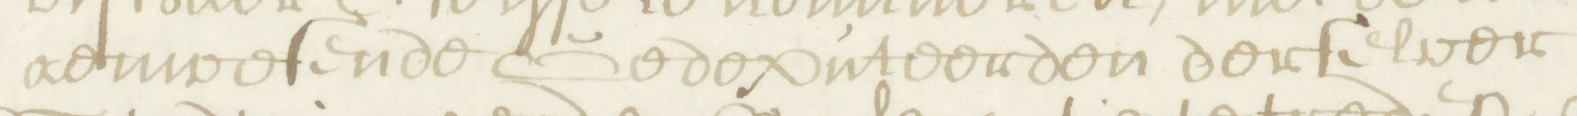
aenwesende Gedeputeerden derselver
